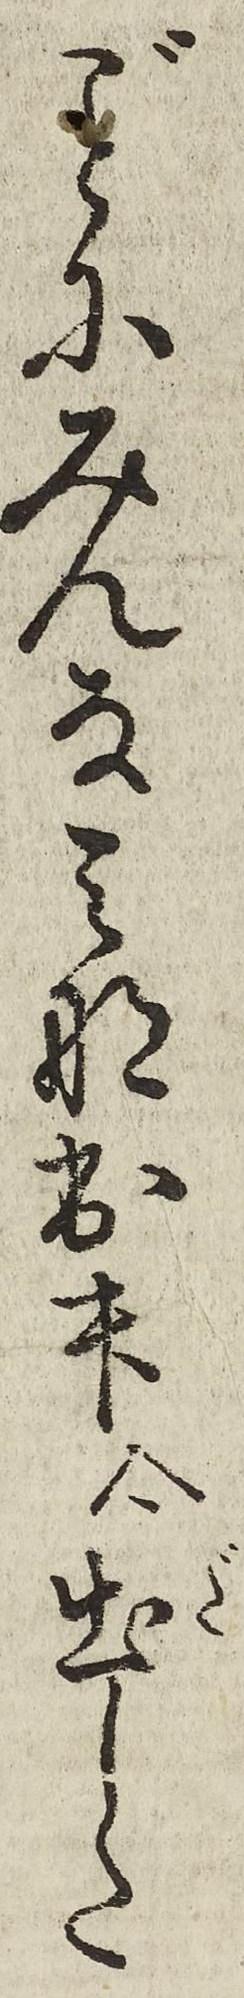ごとにみんなみな出升、出した
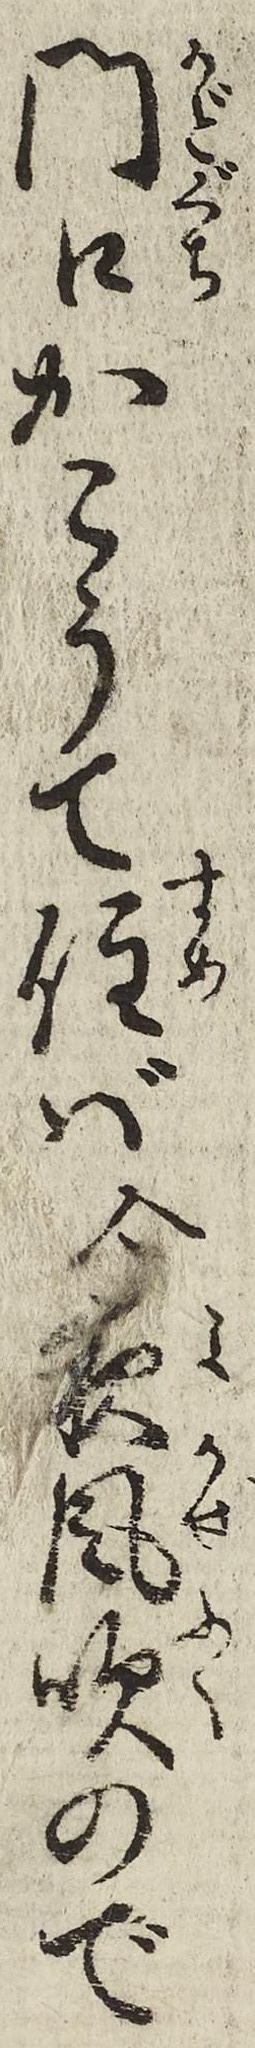門口かこうて住ば、夜風吹ので
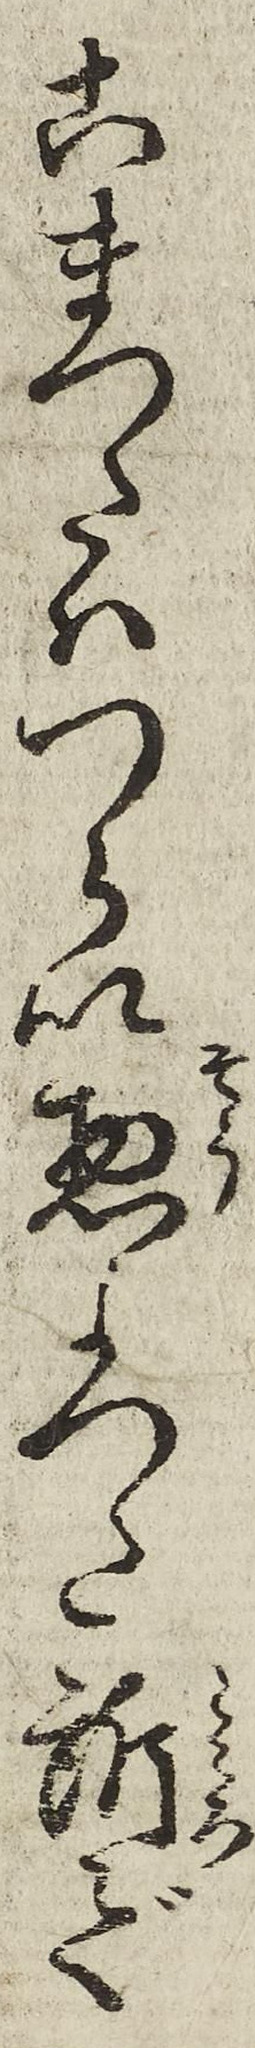こまつたはつらい惣よつた所で
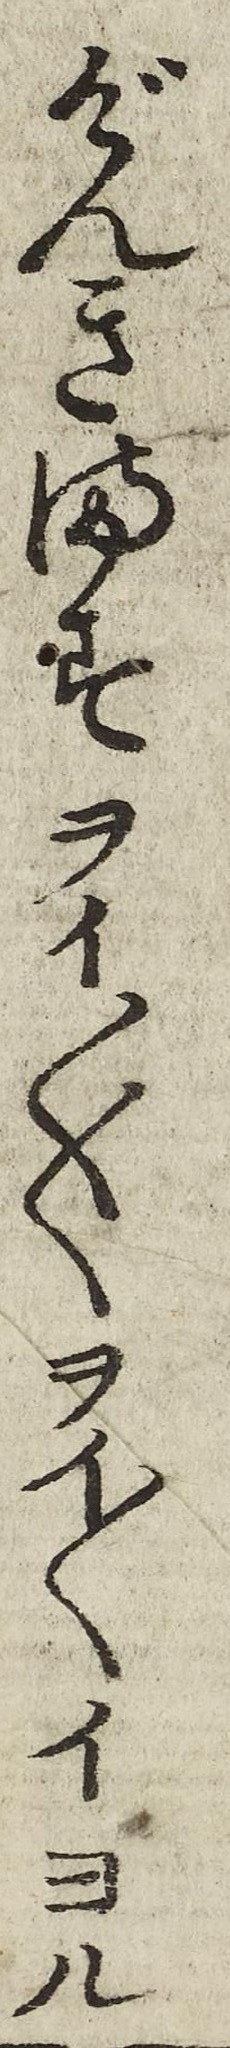げんきますヲイ〳〵〳〵ヲイ〳〵イヨル
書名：地震津浪末代噺の種　全
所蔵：東京大学地震研究所図書室 Earthquake Research Institute Library, The University of Tokyo, JAPAN
